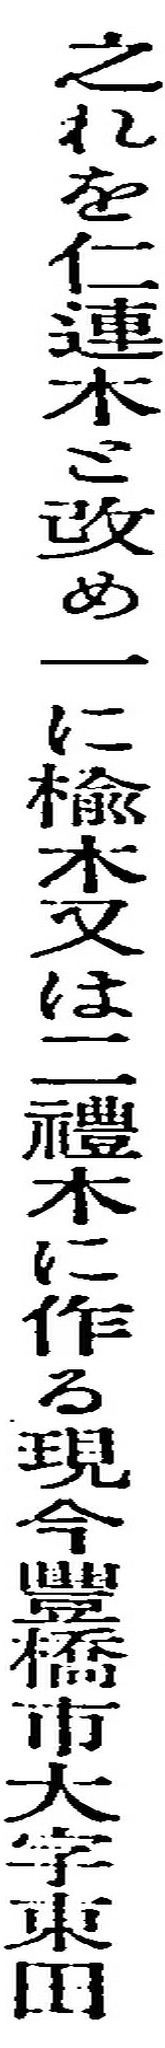之れを仁連木と改め一に楡木又は二禮木に作る現今豐橋市大字東田
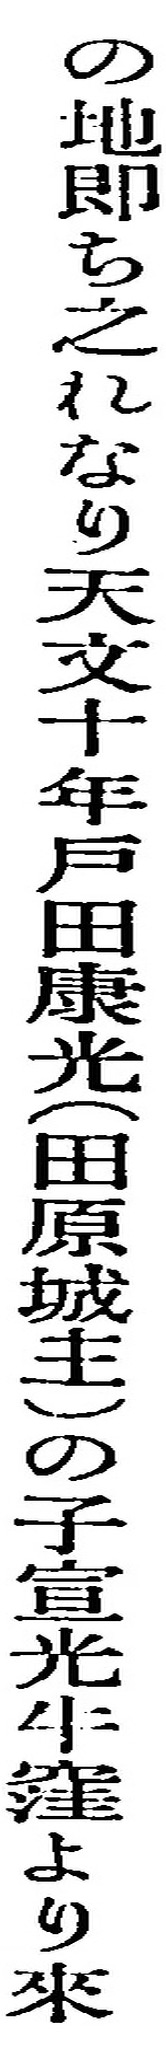の地即ち之れなり天文十年戸田康光(田原城主)の子宣光牛窪より來
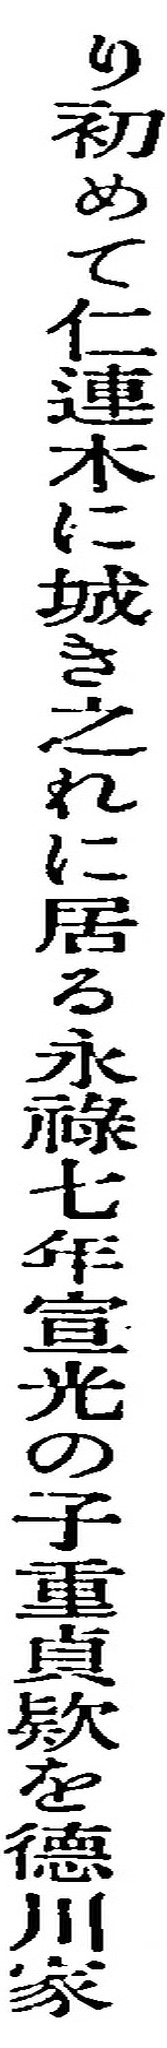り初めて仁連木に城き之れに居る永祿七年宣光の子重貞欵を德川家
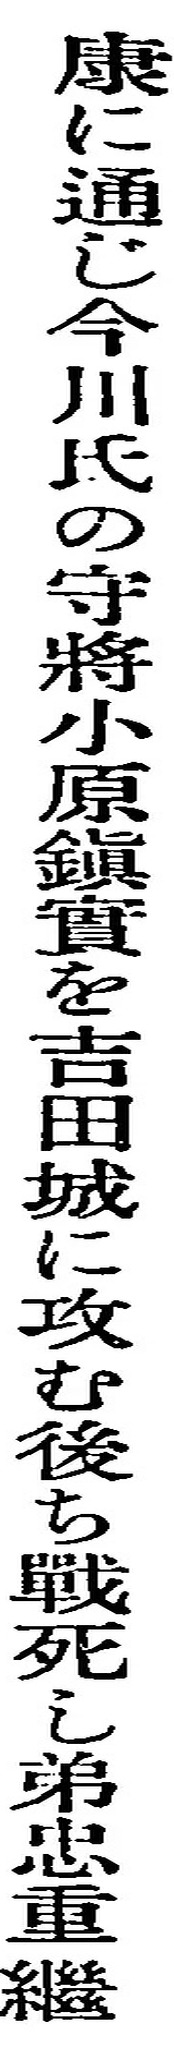康に通じ今川氏の守將小原鎭實を吉田城に攻む後ち戰死し弟忠重繼
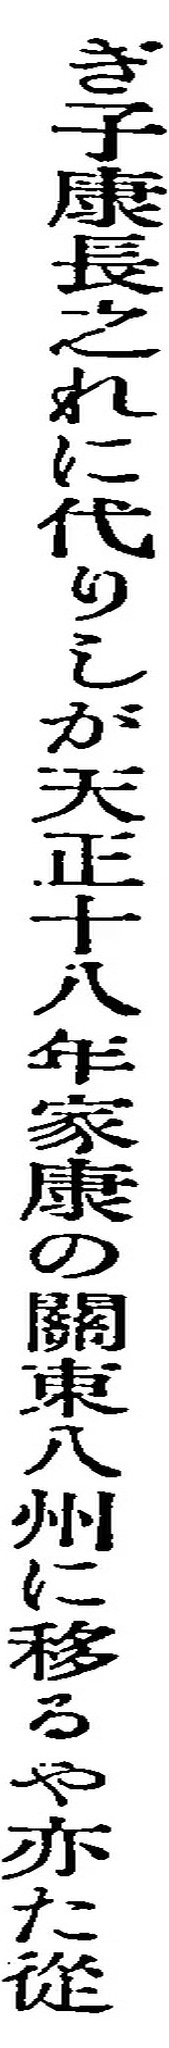ぎ子康長之れに代りしが天正十八年家康の關東八州に移るや亦た從
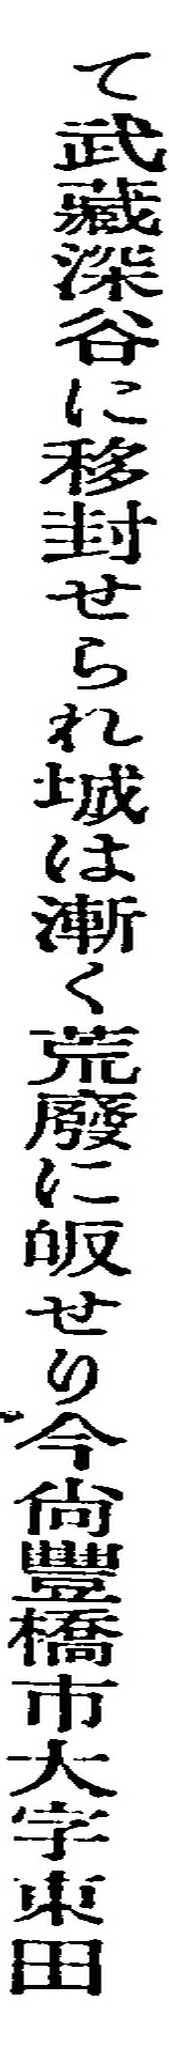て武藏深谷に移封せられ城は漸く荒廢に皈せり今尚豐橋市大字東田
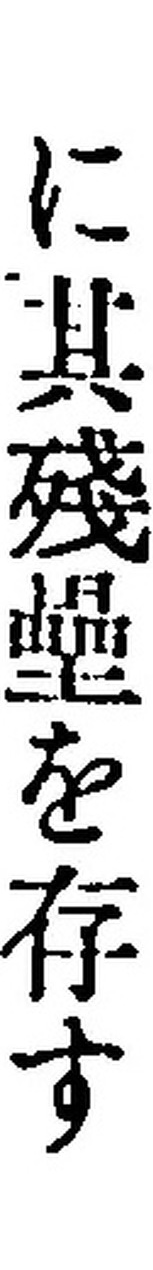に其殘壘を存す
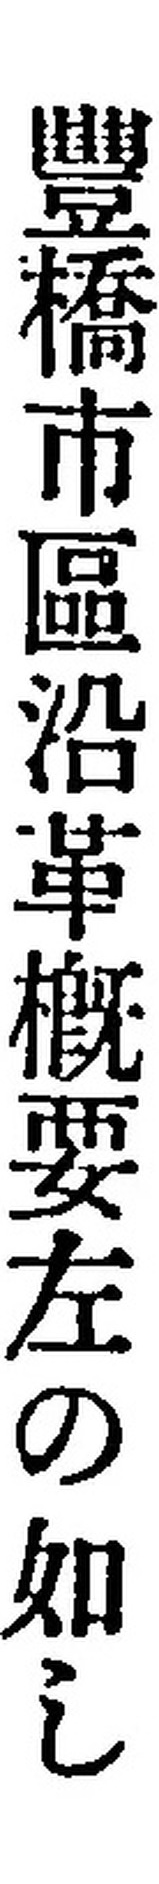豐橋市區沿革槪要左の如し
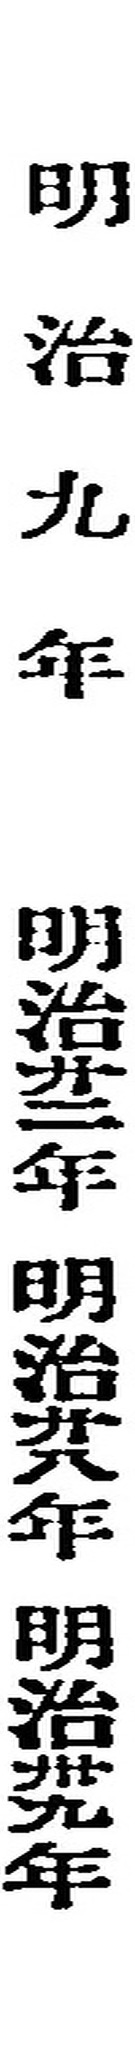明治九年明治卄二年明治卄八年明治卅九年

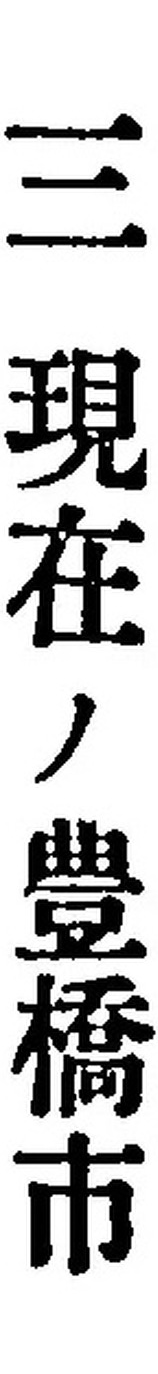三現在ノ豊橋市
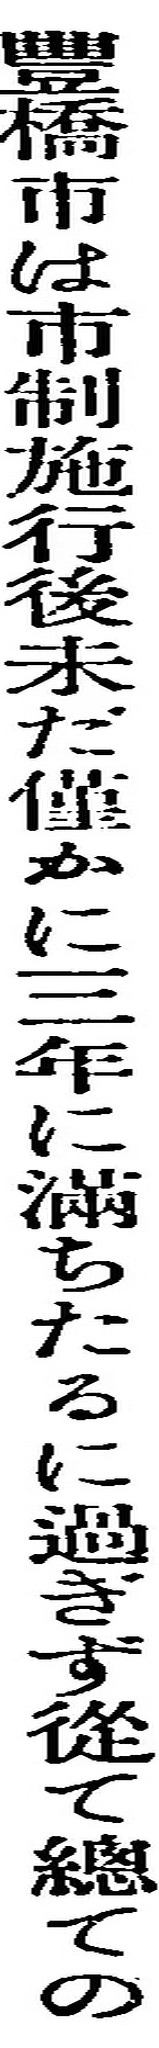豐橋市は市制施行後未だ僅かに三年に滿ちたるに過ぎず從て總ての
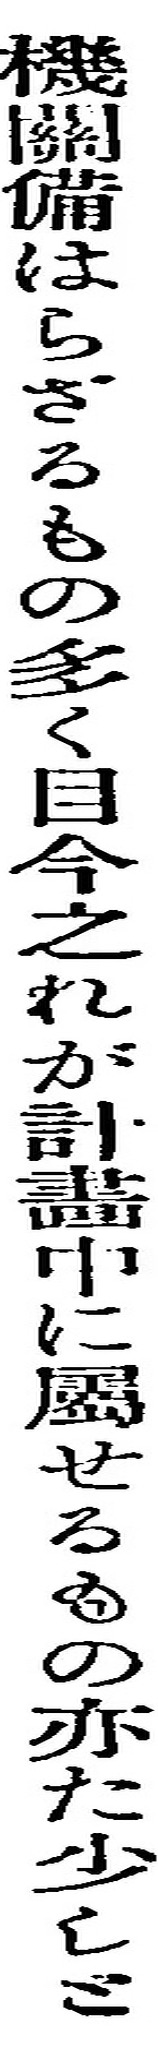機關備はらざるもの多く目今之れが計畵中に屬せるもの亦た少しと
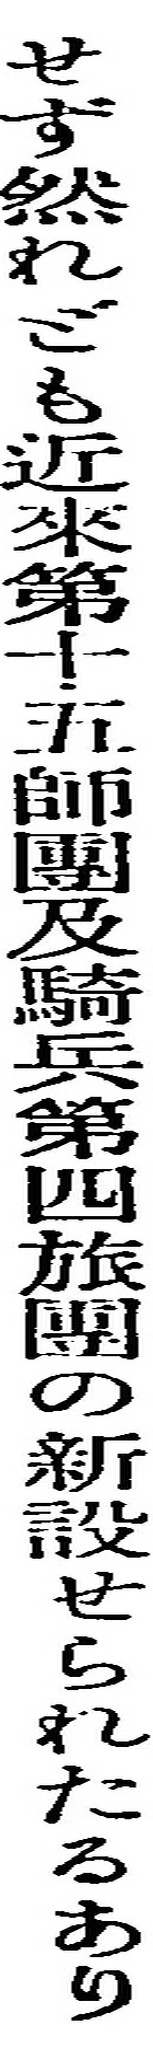せず然れども近來第十五師團及騎兵第四旅團の新設せられたるあり
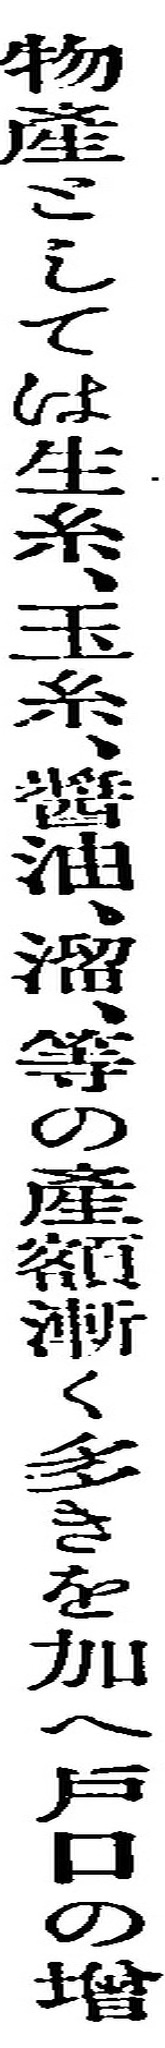物產としては生糸、玉糸、醬油、溜、等の產額漸く多きを加へ戸口の增
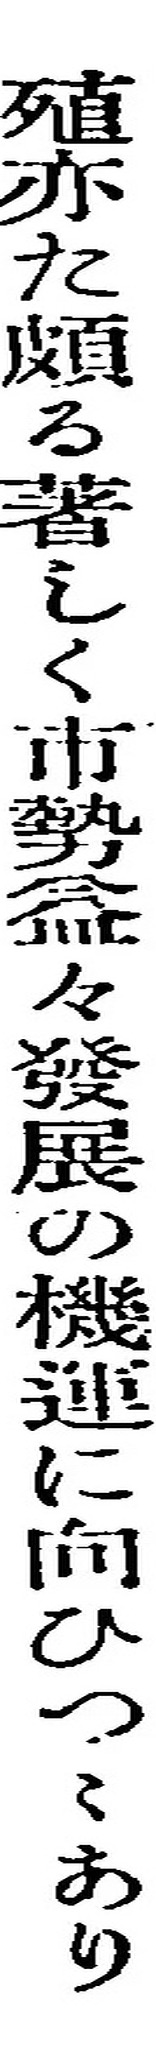殖亦た頗る著しく市勢益々發展の機運に向ひつゝあり
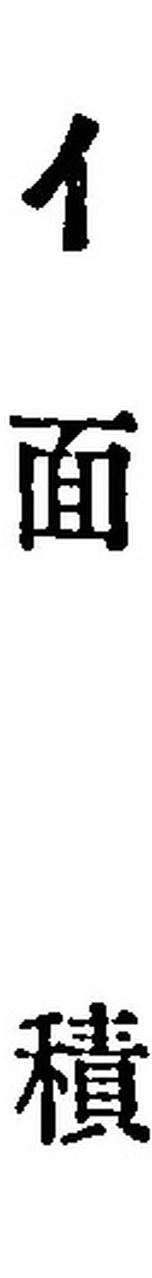イ面積
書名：豊橋志要
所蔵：国立国会図書館 National Diet Library, JAPAN
